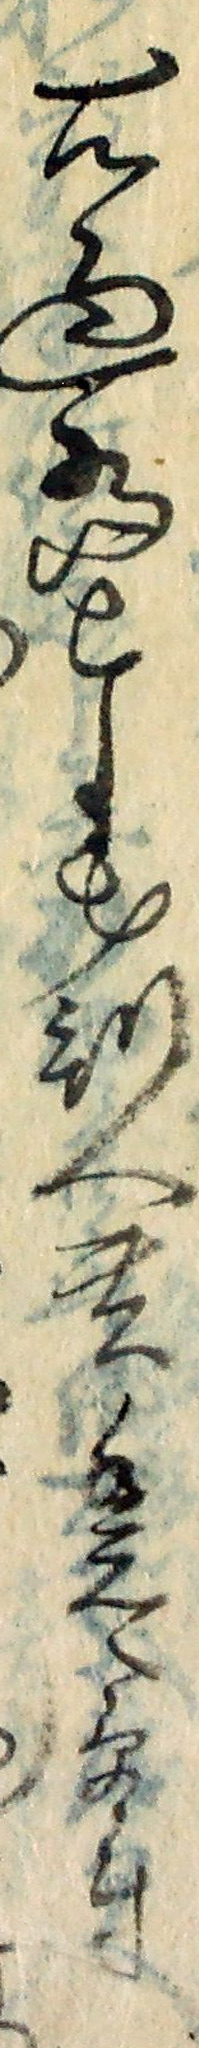右之通当七月才料人共手元へ受付
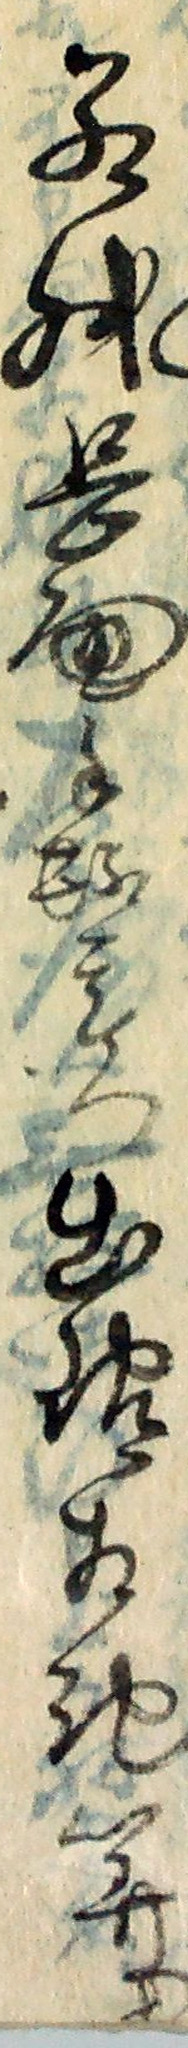別紙長面手塚甚右衛門出銀へ相記算用
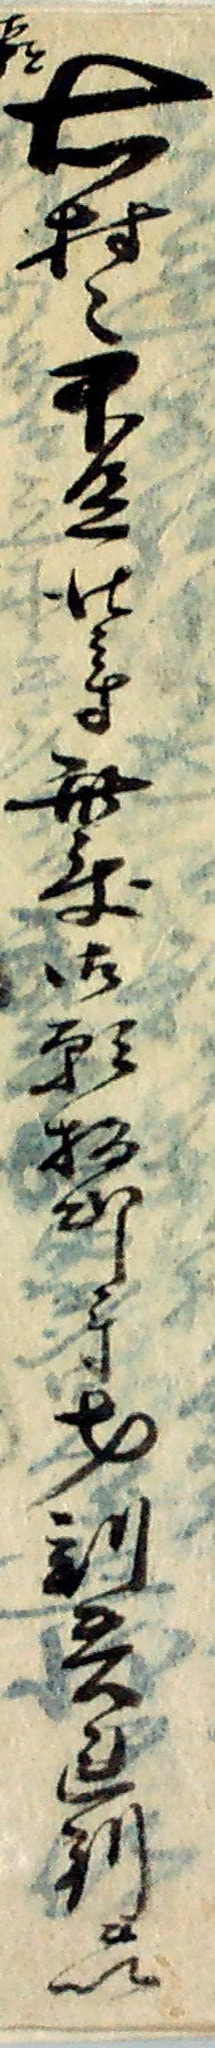右村々不足仕候に付此度御願指出し候付才判共連判を以
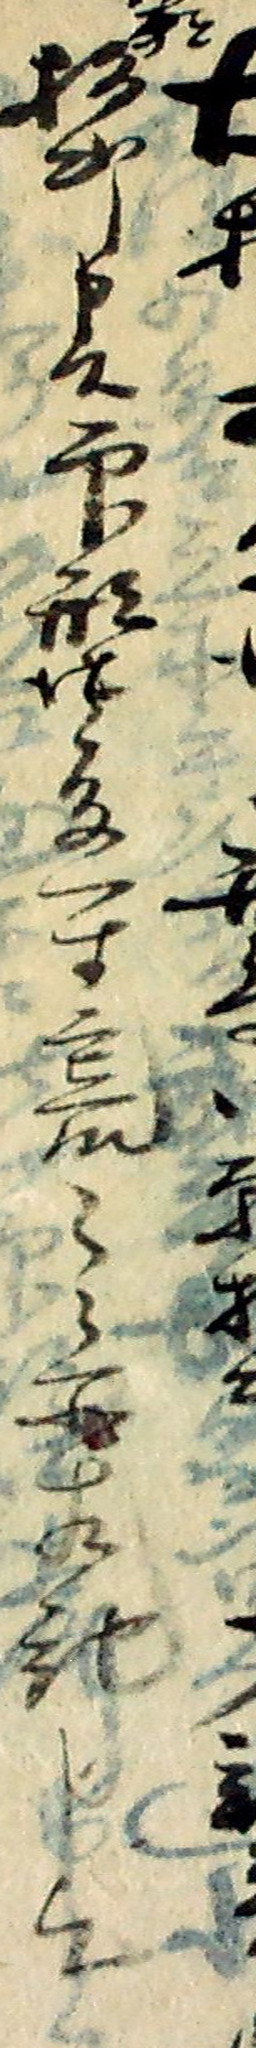御願指出し申候印形仕度一寸荒々之所相記し候
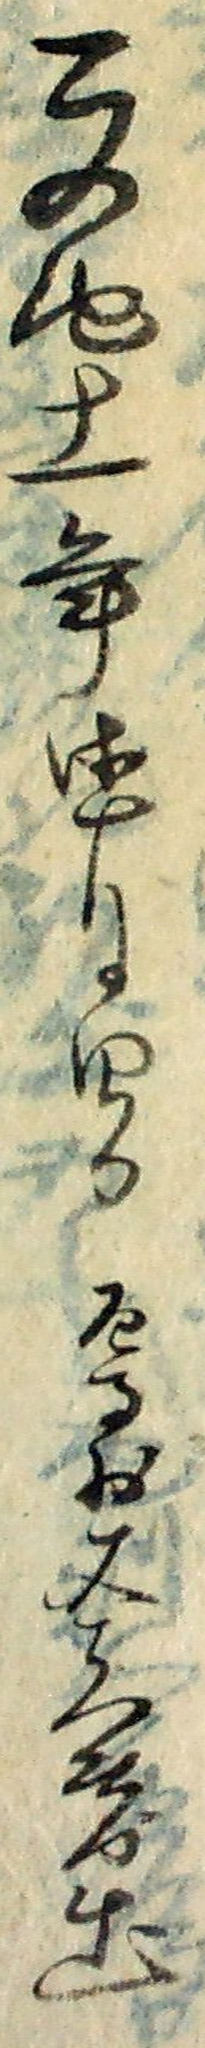文化十一年戌十月四日尼寺村丈右衛門兵右衛門出
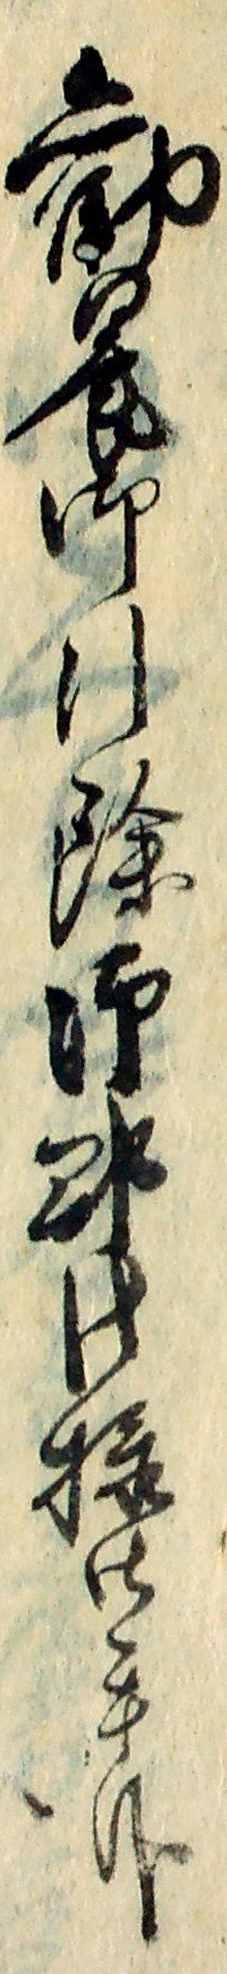勧農御引除御郡代様御手代
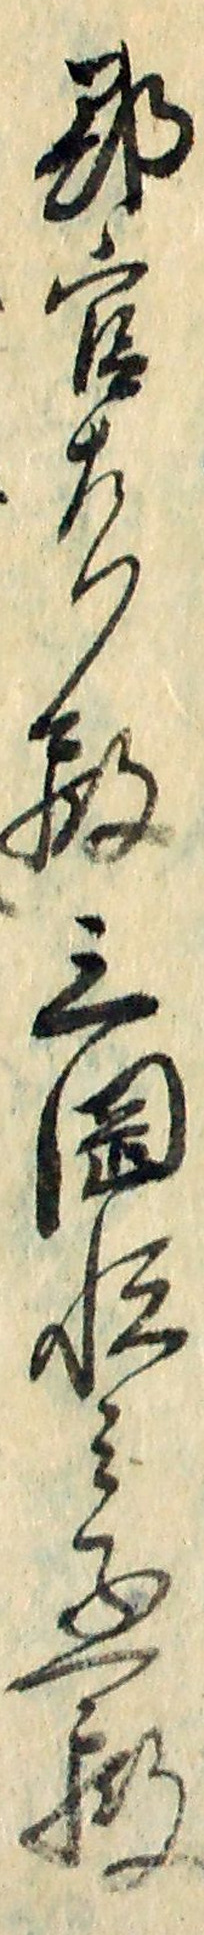郡官左衛門殿三岡悦之丞殿
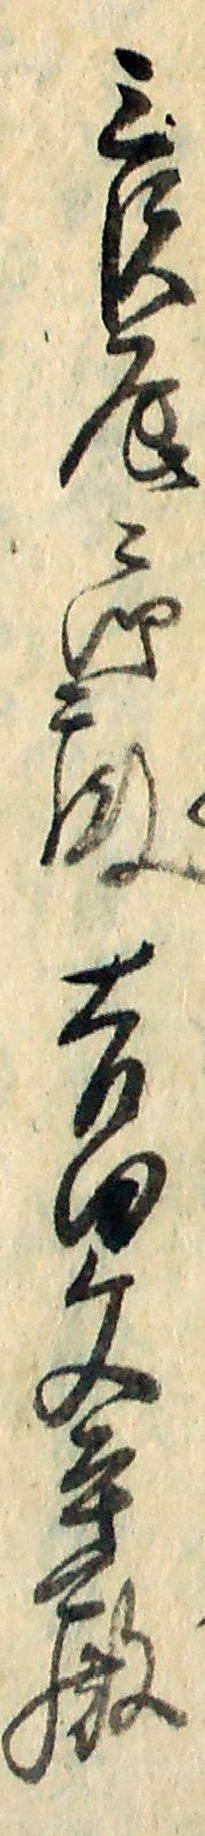三沢辰郎殿吉田文平殿

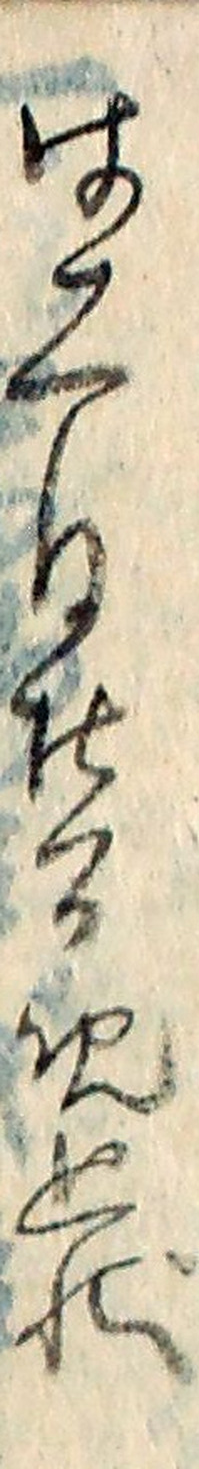戌十一月廿一日に廻状
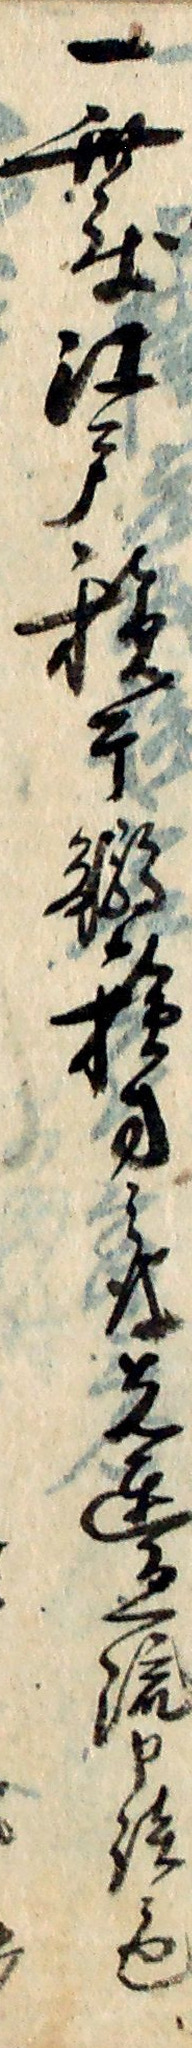一此度江戸積干鰯積方之儀先達て一流申談候通
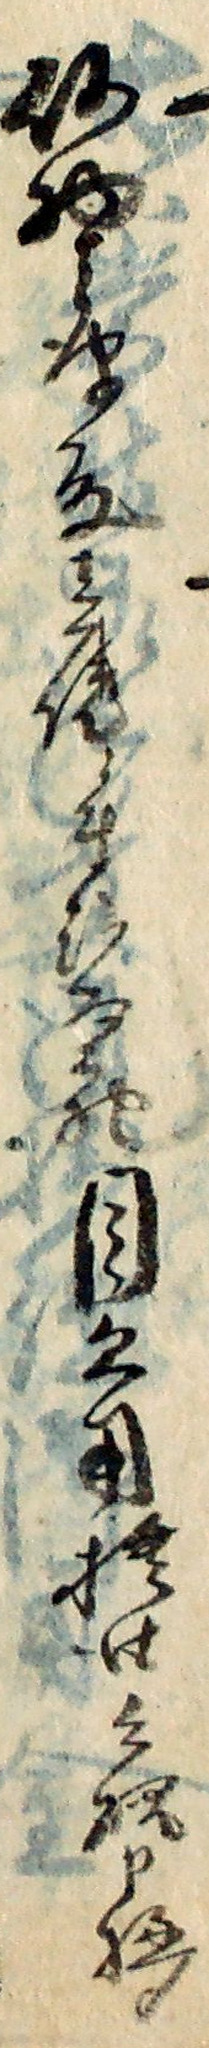砂物之儀故壱俵に付弐百宛目欠用捨仕候様申極め
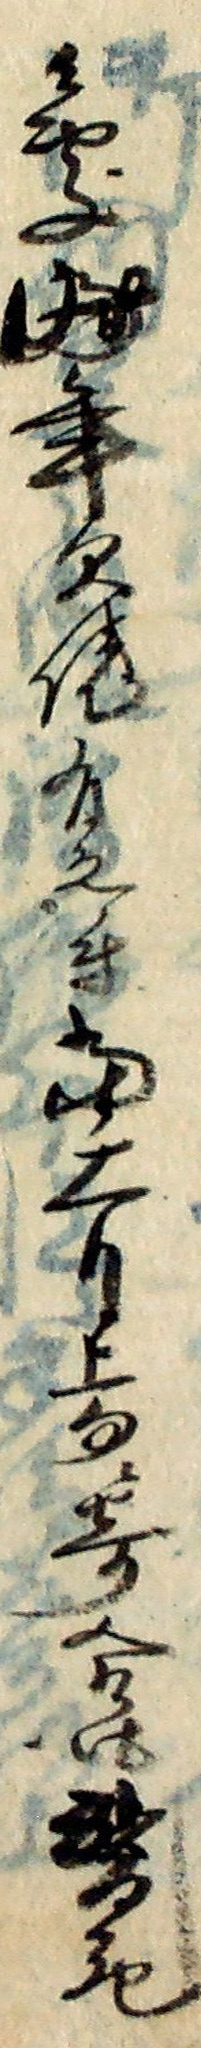候処昨年欠俵有之付当十一月上旬に寄合仕弐百宛
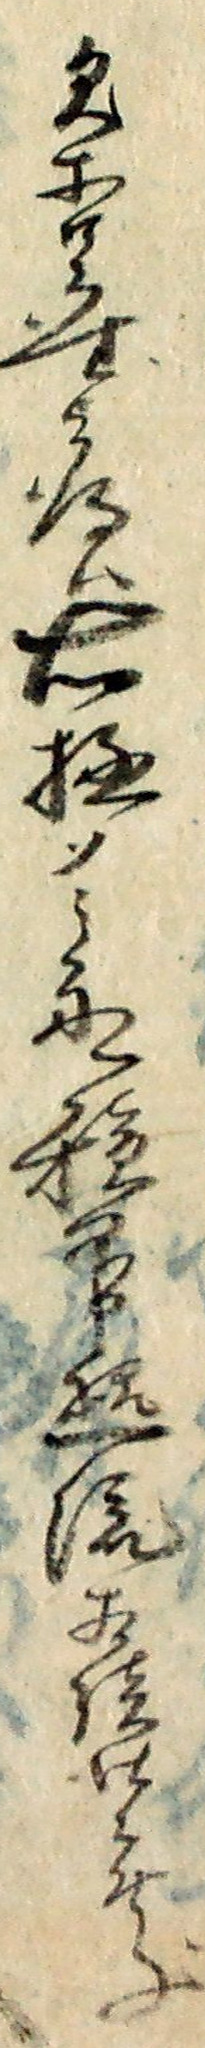欠等御座候得は右極め之船積不申様一流相談仕候処
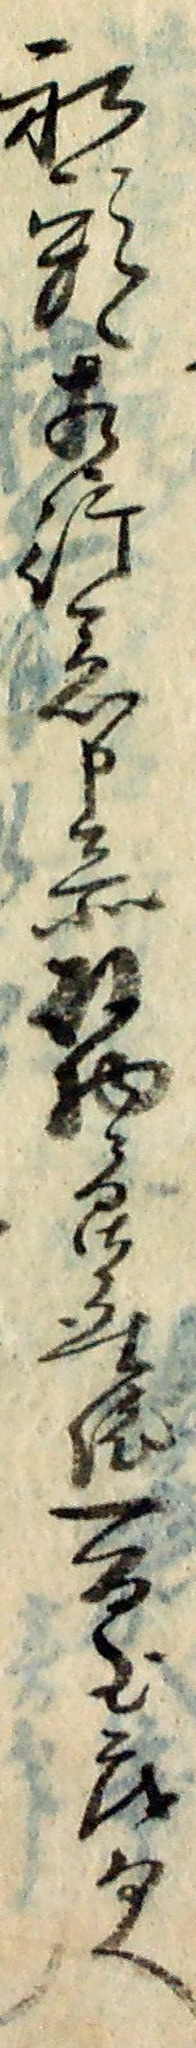船預へ相行着申候所砂物にて御座俵一百匁も欠
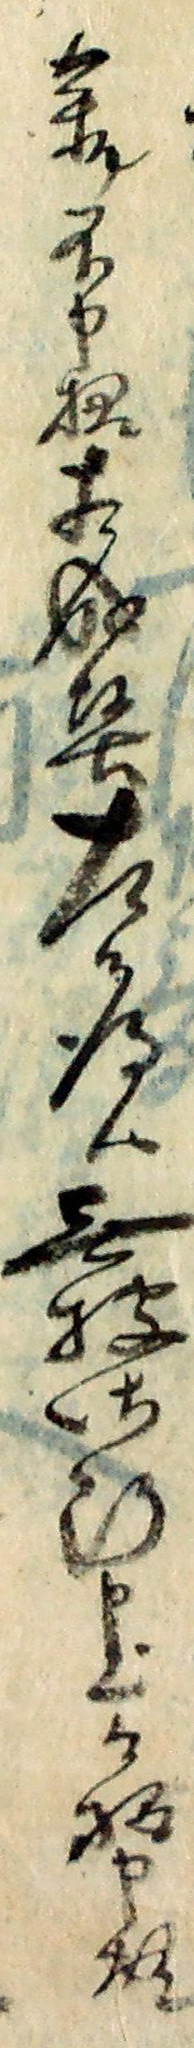参り不申様相成筈左候得は無拠御断申上候様申聞
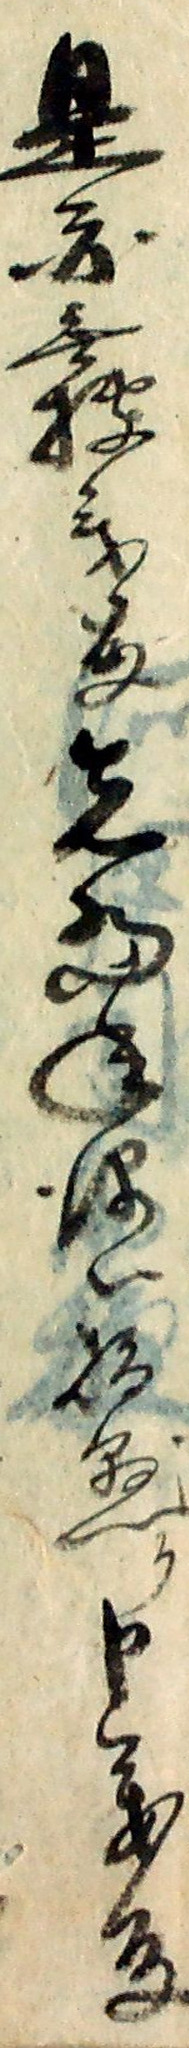是亦無拠義為先当年儀は指懸り申義故
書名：諸御願書控(後藤氏壱番）
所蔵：鳴門教育大学 Naruto University of Education
